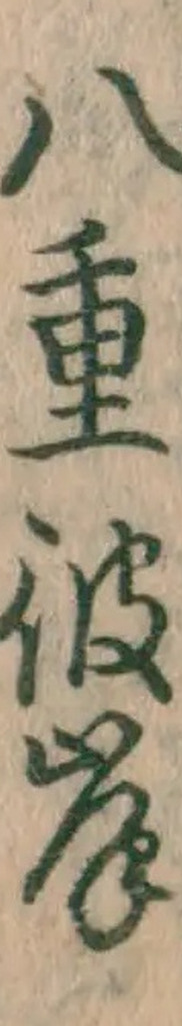八重彼岸

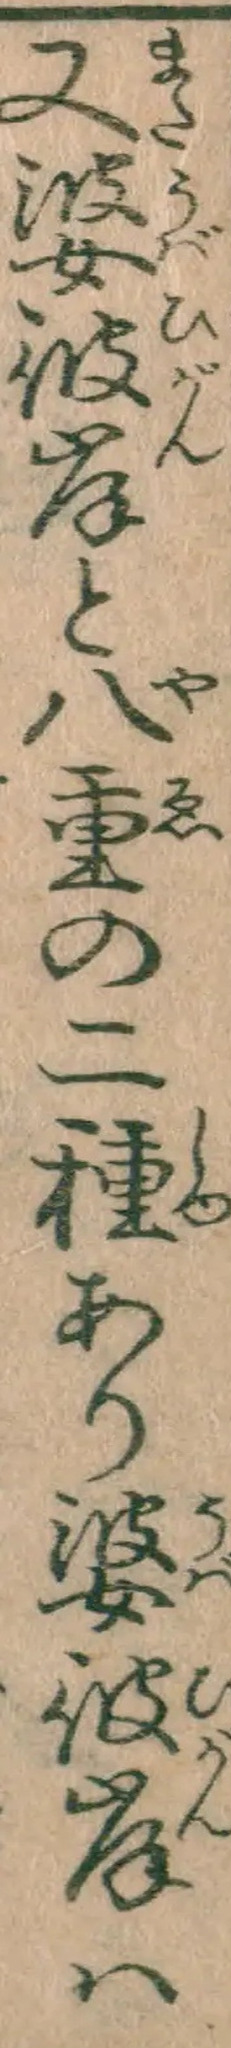又婆彼岸と八重の二種あり婆彼岸は
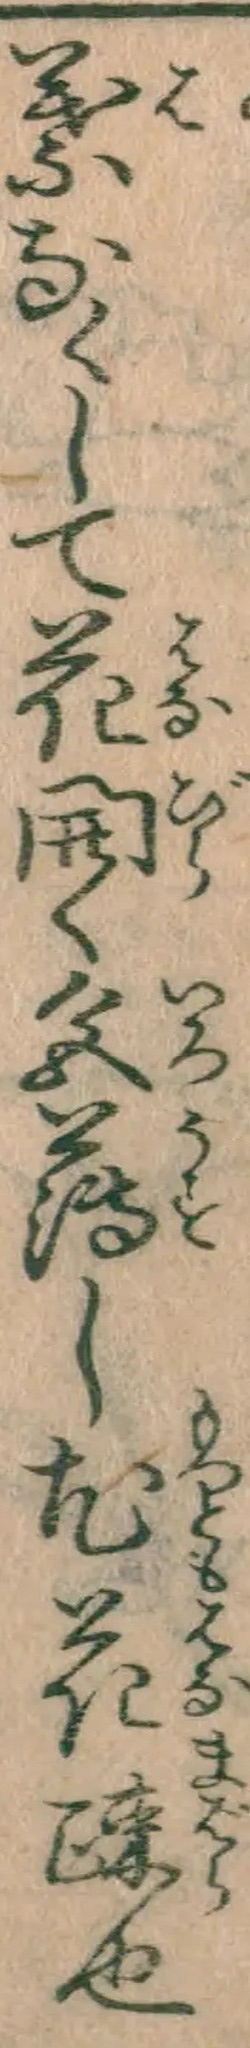葉なくして花開く色薄し尤花疎也
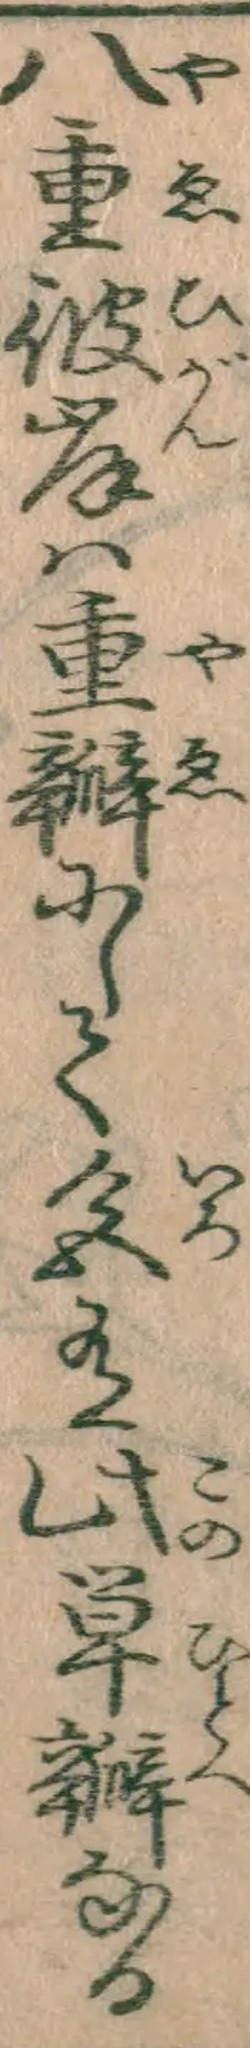八重彼岸は八弁にして色有此単弁なる
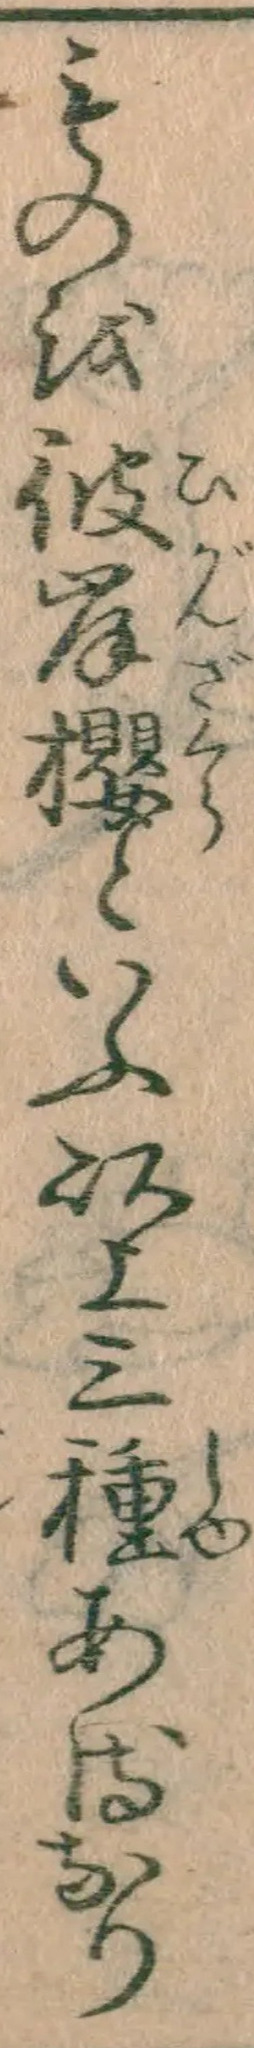ものを彼岸桜といふ以上三種あるなり
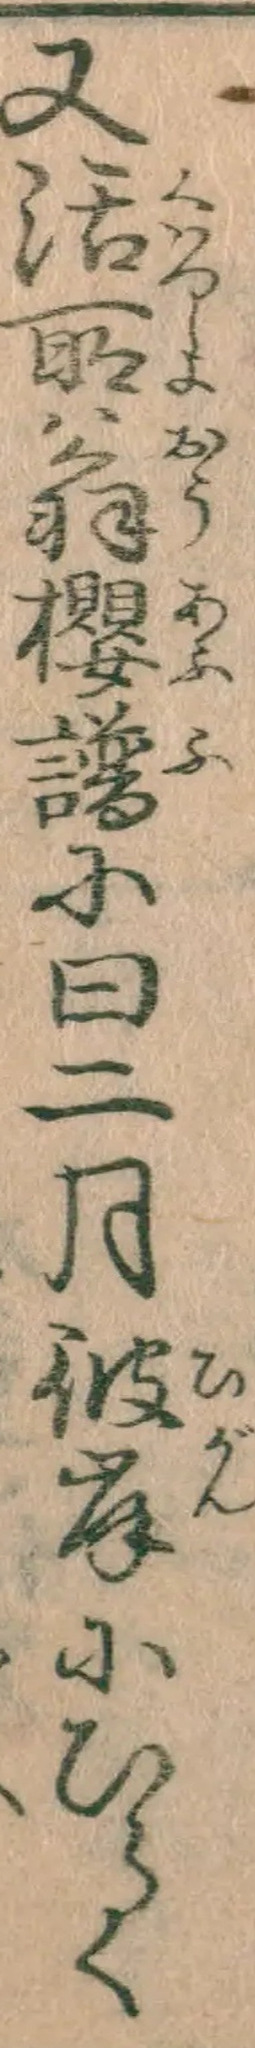又活所翁桜譜に曰二月彼岸にひらく
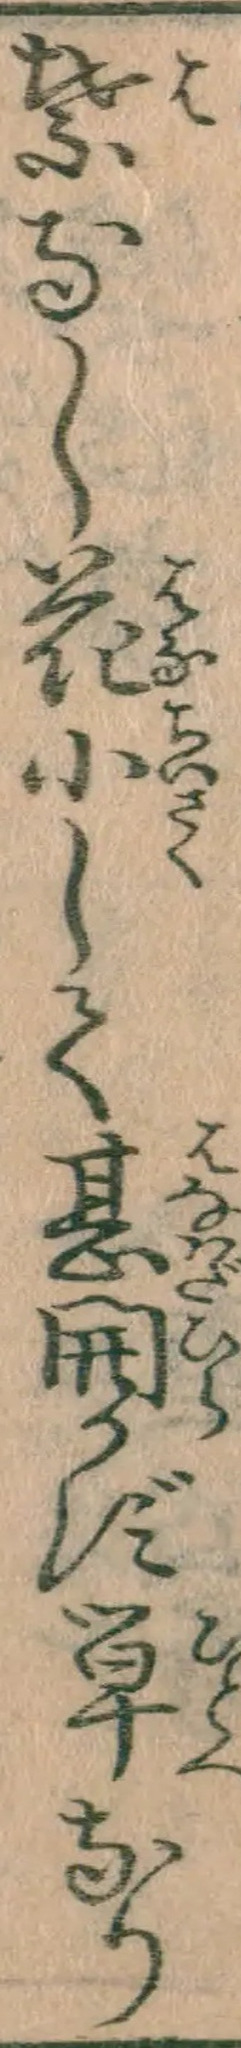葉なし花小して甚開かず単なり
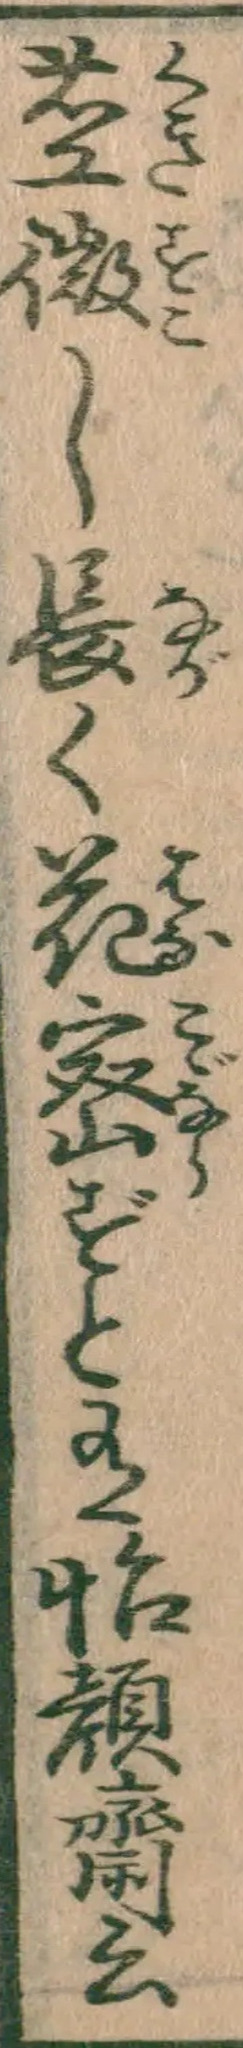茎微し長く花密ずと有怡顔斎云
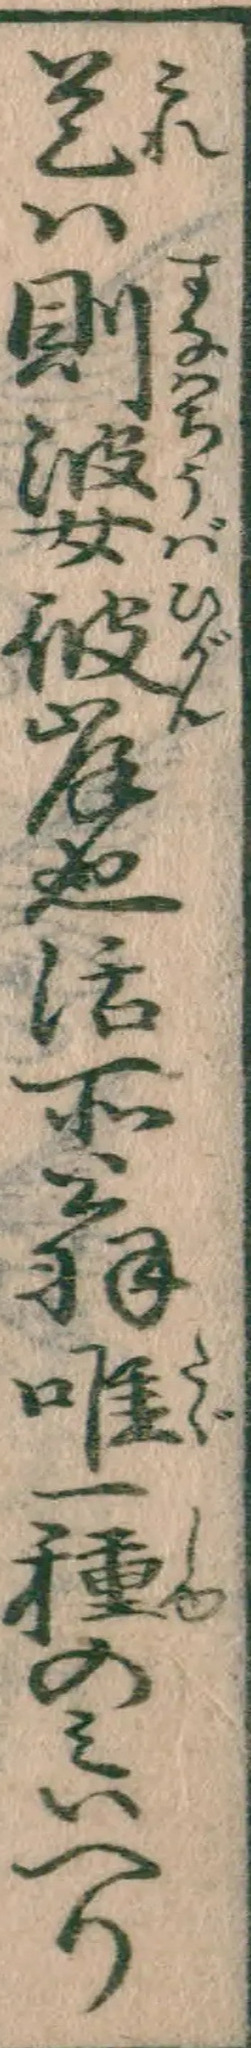是は則婆彼岸也活所翁唯一種のみいへり
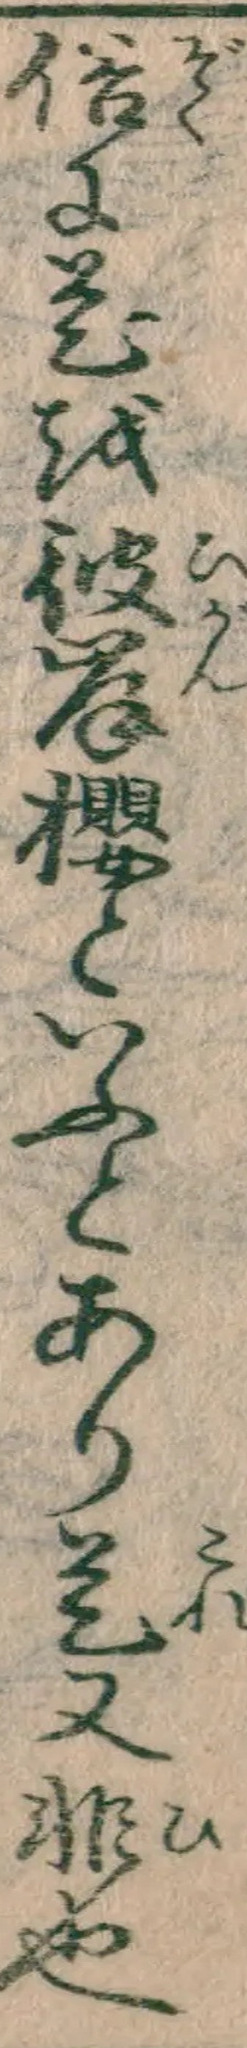俗に是を彼岸桜といふとあり是又非也
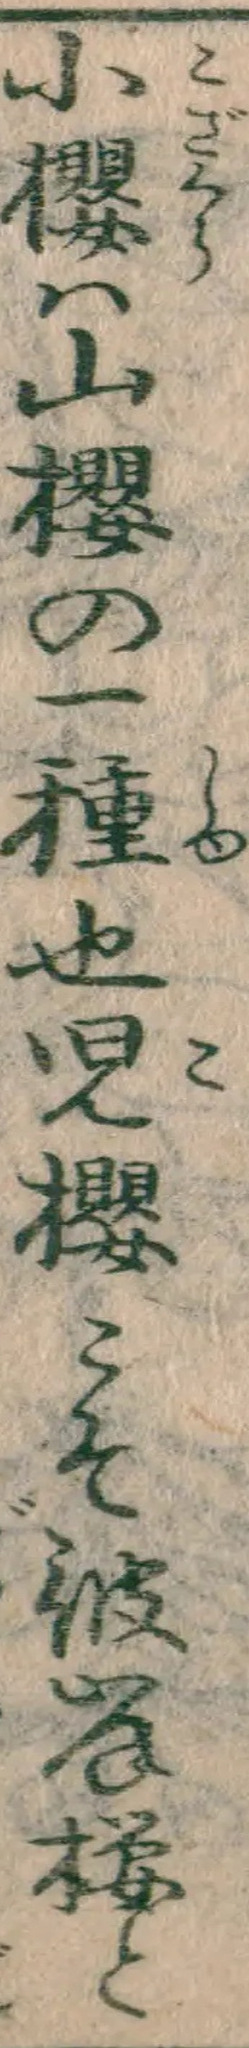小桜は山桜の一種也児桜こそ彼岸桜と
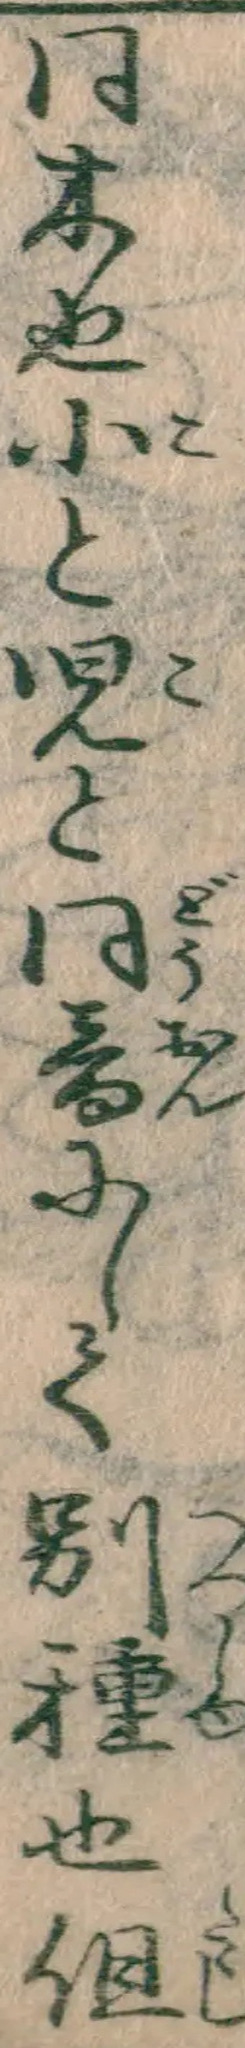同木也小と児と同音にして別種也但
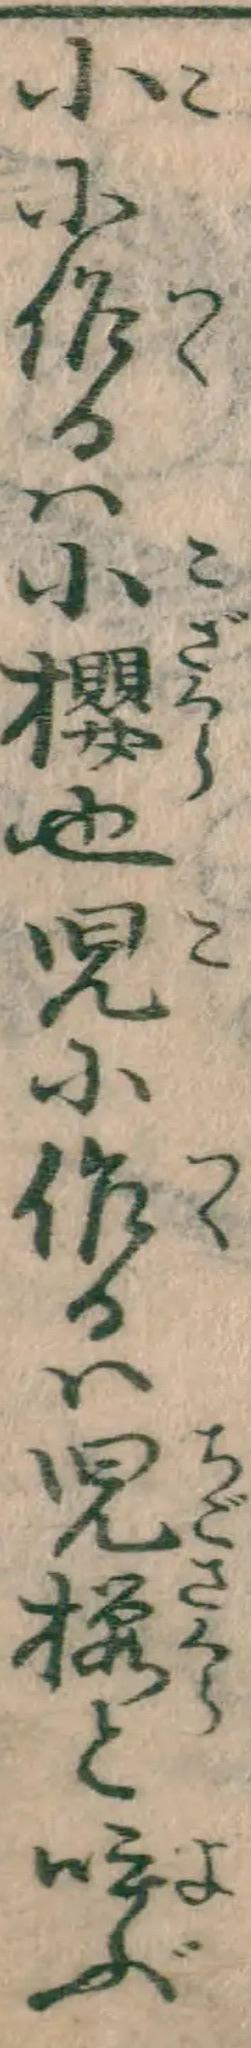小に作るは小桜也児に作るは児桜と呼ぶ

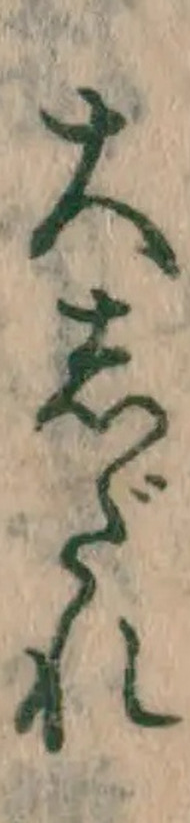大しだれ
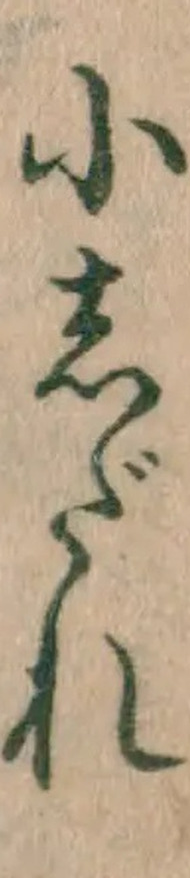小しだれ

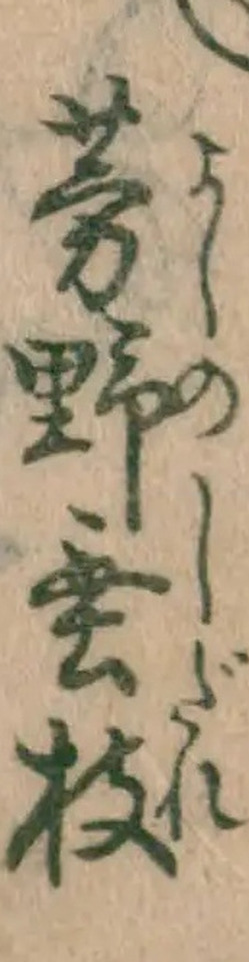芳野垂枝
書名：怡顔齋櫻品
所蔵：国立国会図書館 National Diet Library, JAPAN
